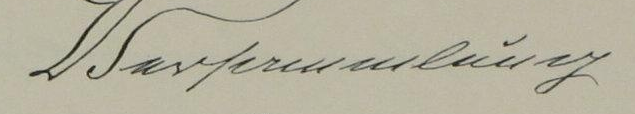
Versammlung
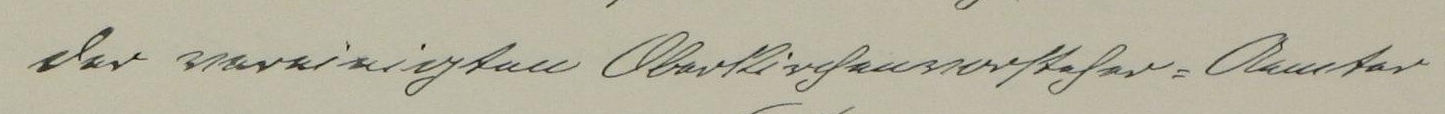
der vereinigten Oberkirchenvorsteher-Aemter
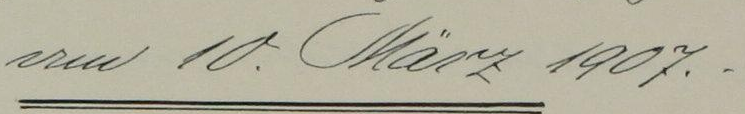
am 10. März 1907.
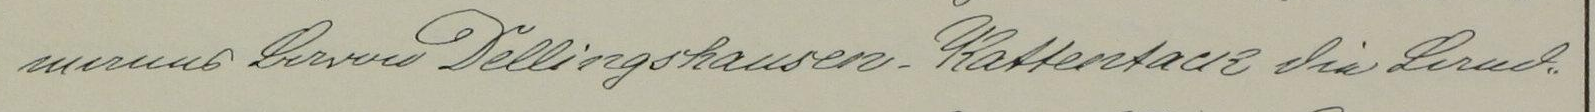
manns Baron Dellingshausen-Kattentack die Land-
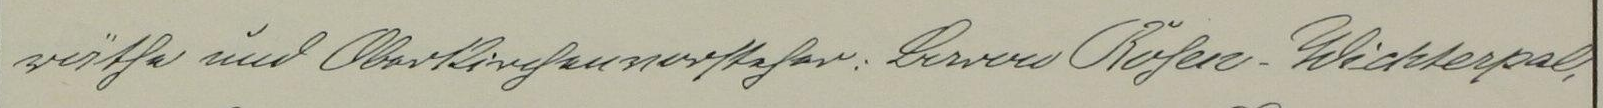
räthe und Oberkirchenvorsteher: Baron Rosen-Wichterpal,
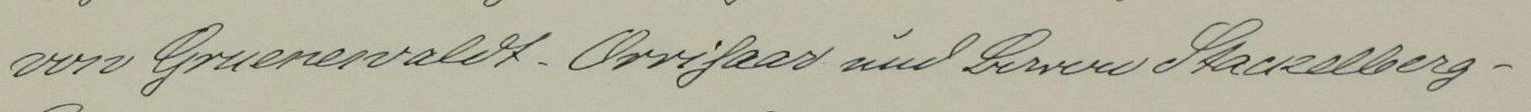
von Gruenewaldt-Orrisaar, und Baron Stackelberg-
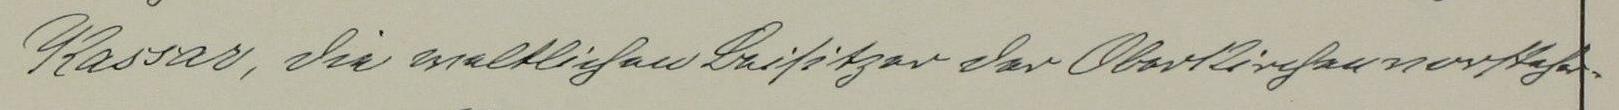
Kassar, die weltlichen Beisitzer der Oberkirchenvorsteher-
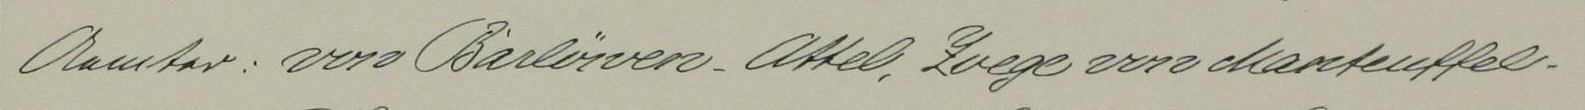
Aemter: von Barlöwen-Attel, Zoege von Manteuffel-
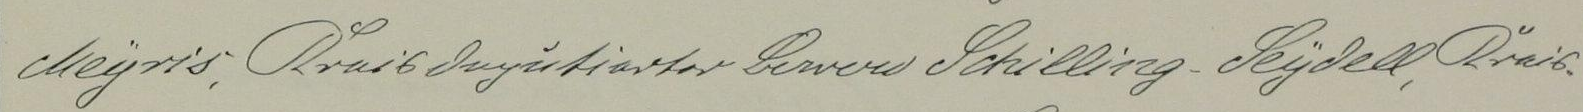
Meyris, Kreisdeputierter Baron Schilling-Seydell, Kreis-
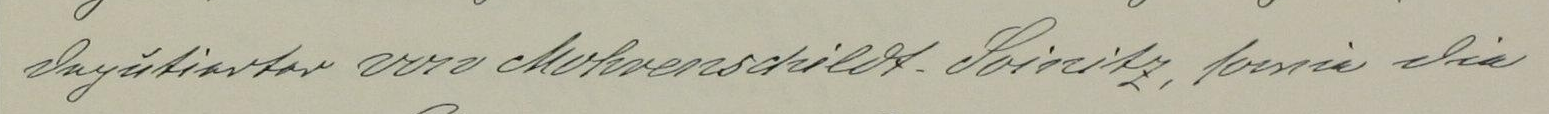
deputierter von Mohrenschildt-Soinitz, ferner die
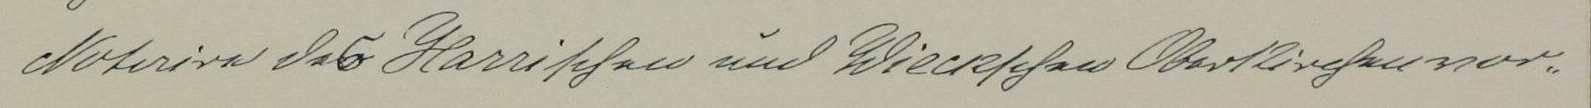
Notaire des Harrischen und Wieckschen Oberkirchenvor-
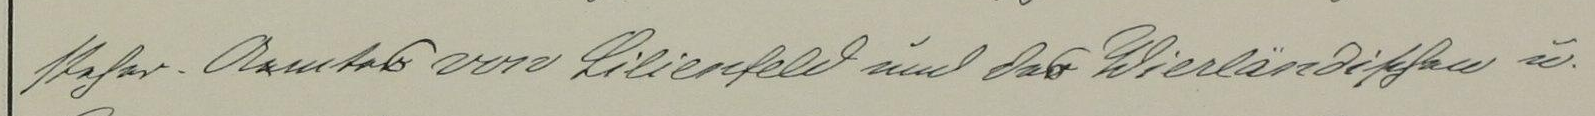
steher-Aemtes von Lilienfeld und des Wierländischen u.
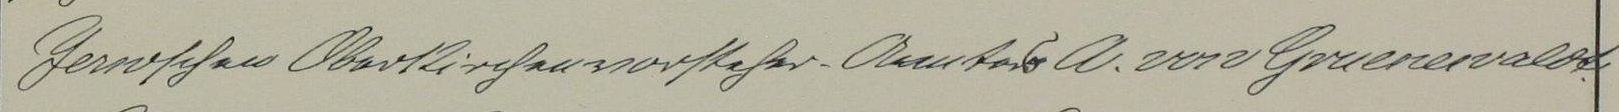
Jerwschen Oberkirchenvorsteher-Aemtes A. von Gruenewaldt.
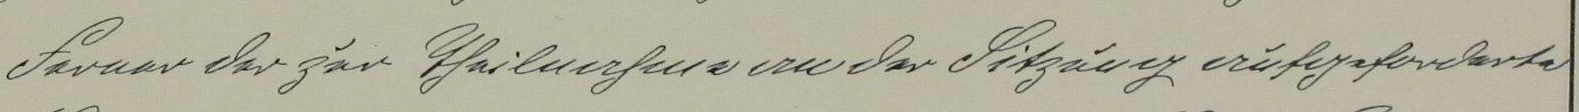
Ferner der zur Theilnahme an der Sitzung aufgeforderte
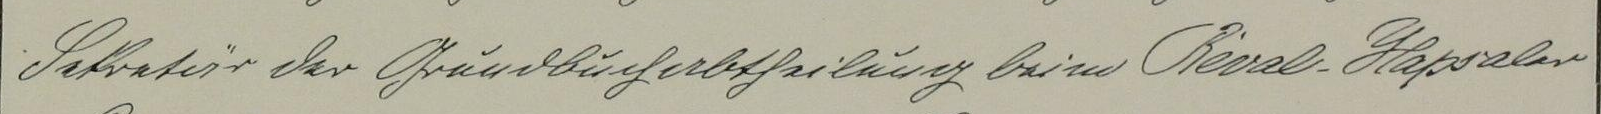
Sekretär der Grundbuchabtheilung beim Reval-Hapsaler
